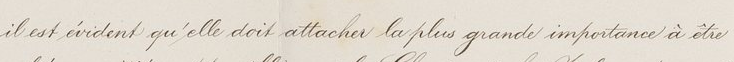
il est évident qu'elle doit attacher la plus grande importance à être
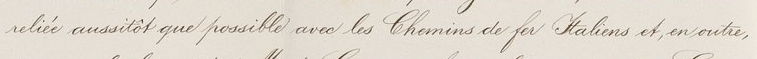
reliée aussitôt que possible avec les Chemins de fer Italiens et, en outre,
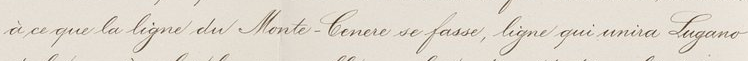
ce que la ligne du Monte-Cenere se fasse, ligne qui unira Lugano
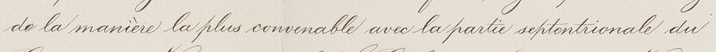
de la manière la plus convenable avec la partie septentrionale du
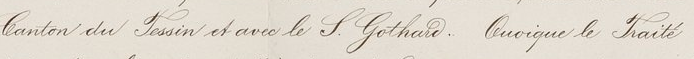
Canton du Tessin et avec le S. Gothard. Quoique le Traité
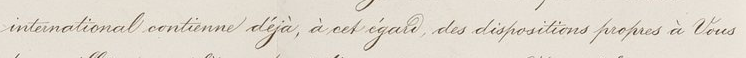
international contienne déjà, à cet égard, des dispositions propres à Vous
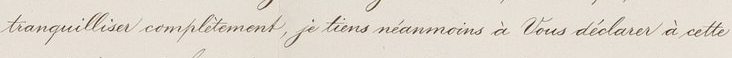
tranquilliser complètement, je tiens néanmoins à Vous déclarer à cette
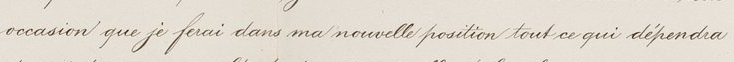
occasion que je ferai dans ma nouvelle position tout ce qui dépendra
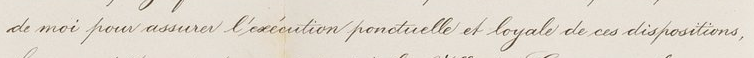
de moi pour assurer l'exécution ponctuelle et loyale de ces dispositions,
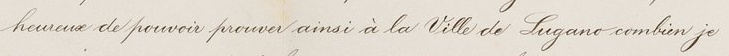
heureux de pouvoir prouver ainsi à la Ville de Lugano combien je
